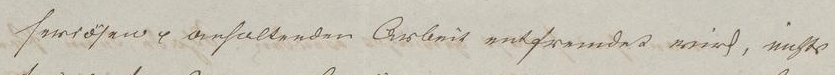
seriösen & anhaltenden Arbeit entfremdet wird, nichts
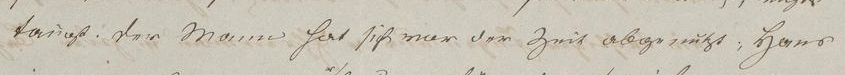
taugt. Der Mann hat sich vor der Zeit abgenutzt; Hans
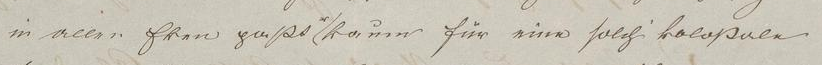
in allen Eken paßt er kaum für eine solch' koloßale
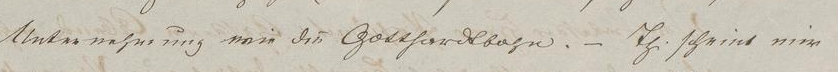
Unternehmung wie die Gotthardtbahn. – Th. scheint mir
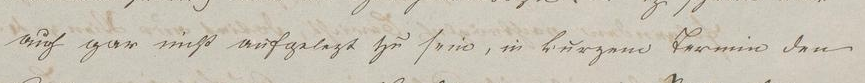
auch gar nicht aufgelegt zu sein, in kurzem Termin den
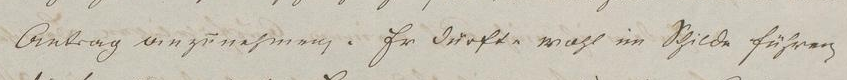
Antrag anzunehmen. Er dürfte wohl im Schilde führen,
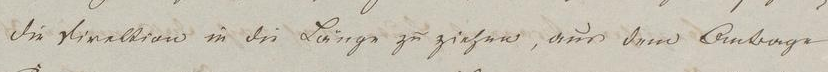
die Direktion in die Länge zu ziehen, aus dem Antrage
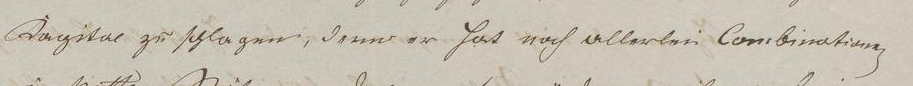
Kapital zu schlagen, denn er hat noch allerlei Combinationen
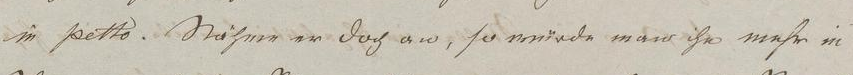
in petto. Nähme er doch an, so würde man ihn mehr in
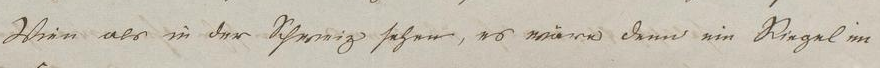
Wien als in der Schweiz sehen, es wäre denn ein Riegel im
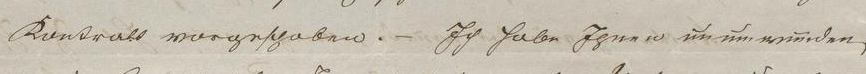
Kontrakt vorgeschoben. – Ich habe Ihnen unumwunden
